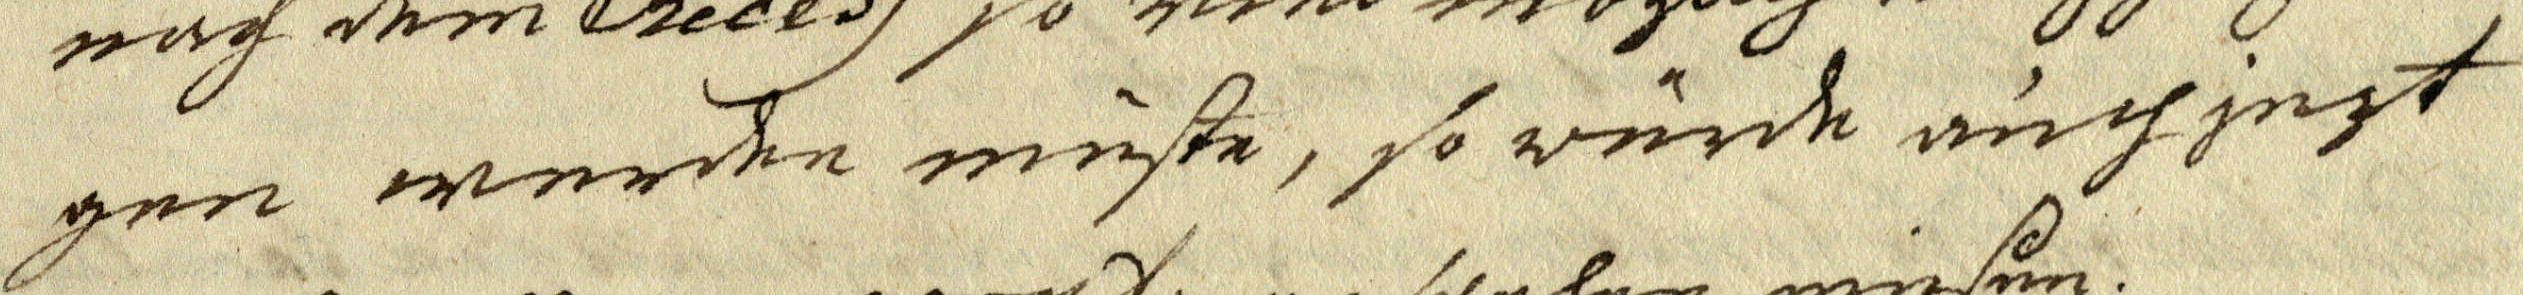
gen werden müste, so würde auch jezt
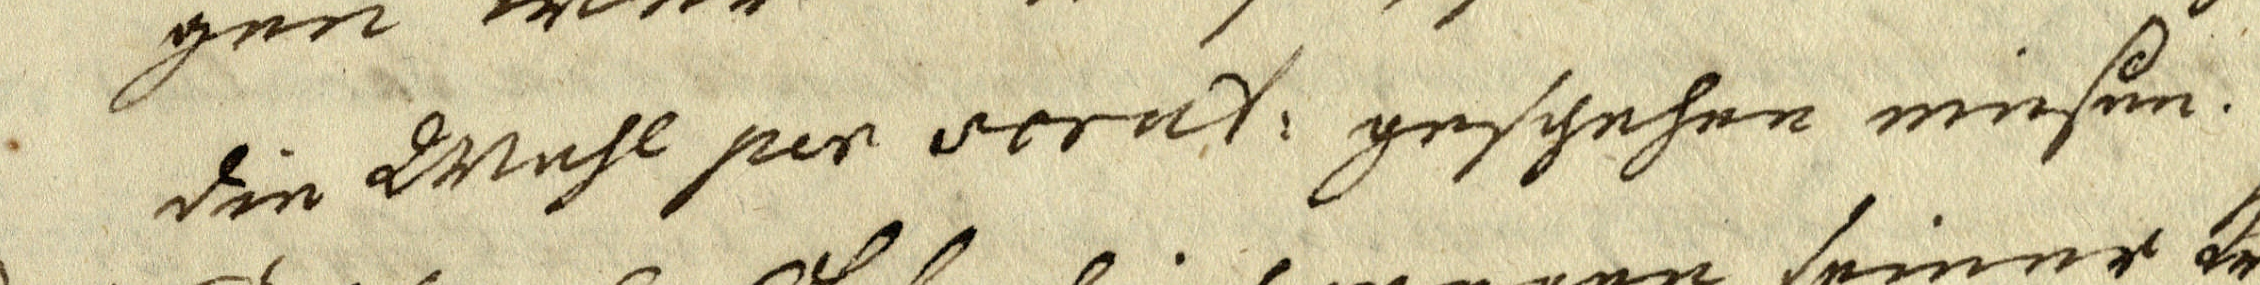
die Wahl per scrut. geschehen müßen.
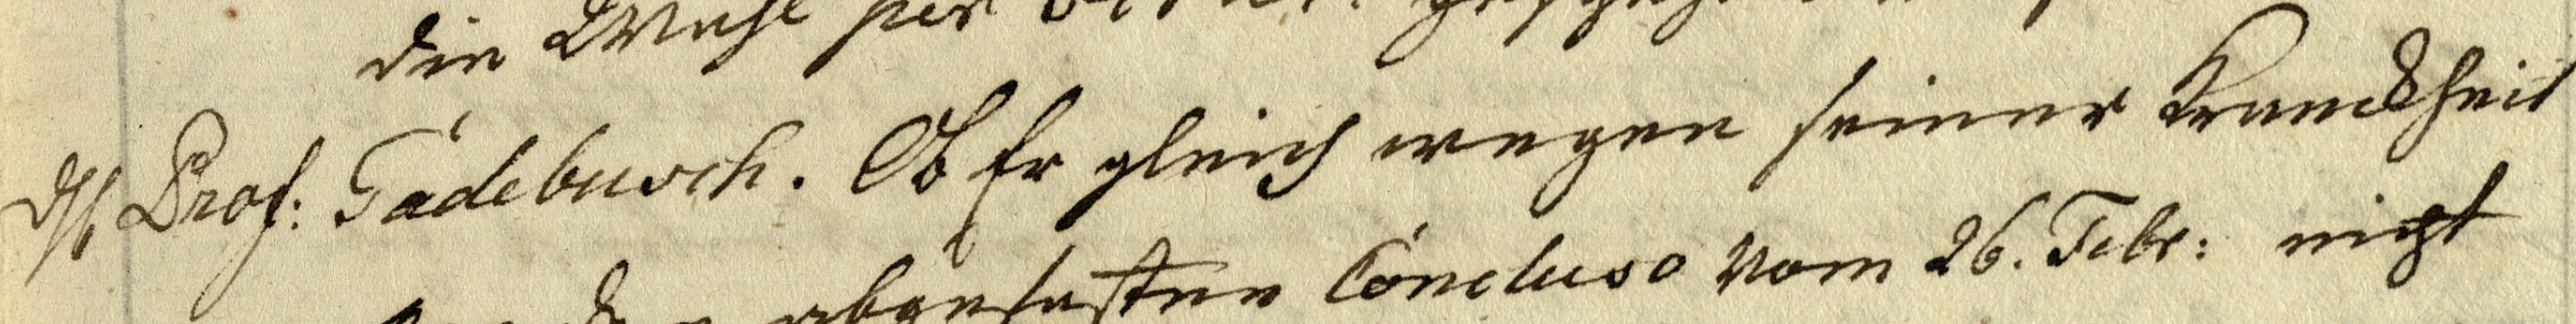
dh. Prof. Gadebusch. Ob Er gleich wegen seiner Kranckheit
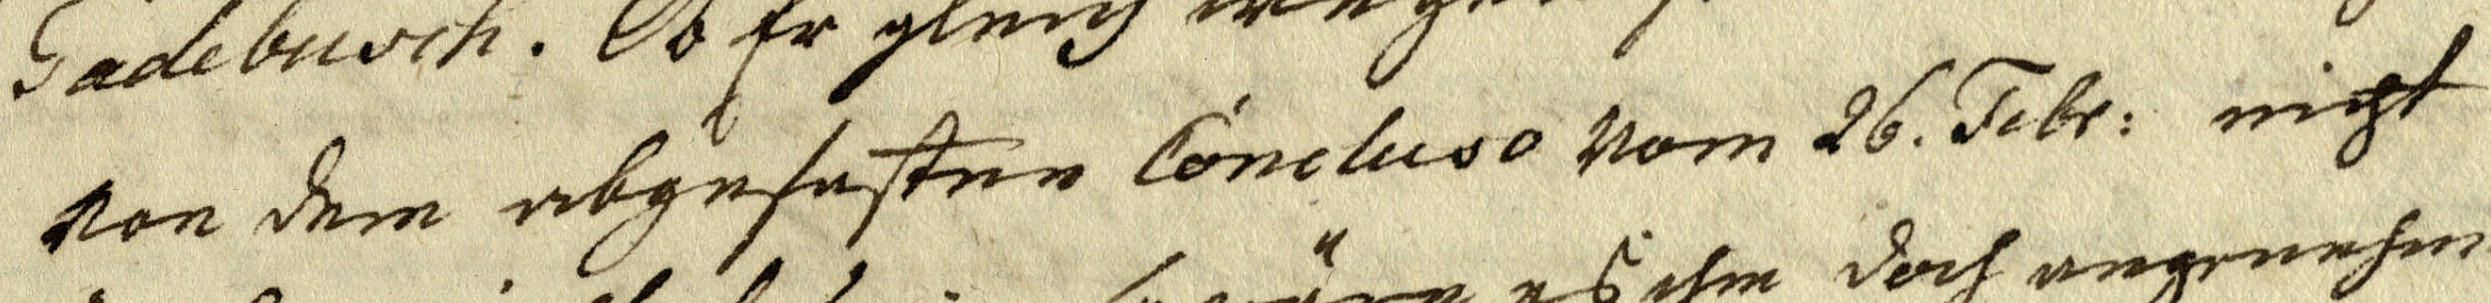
von dem abgefasten Concluso vom 26 Febr. nicht
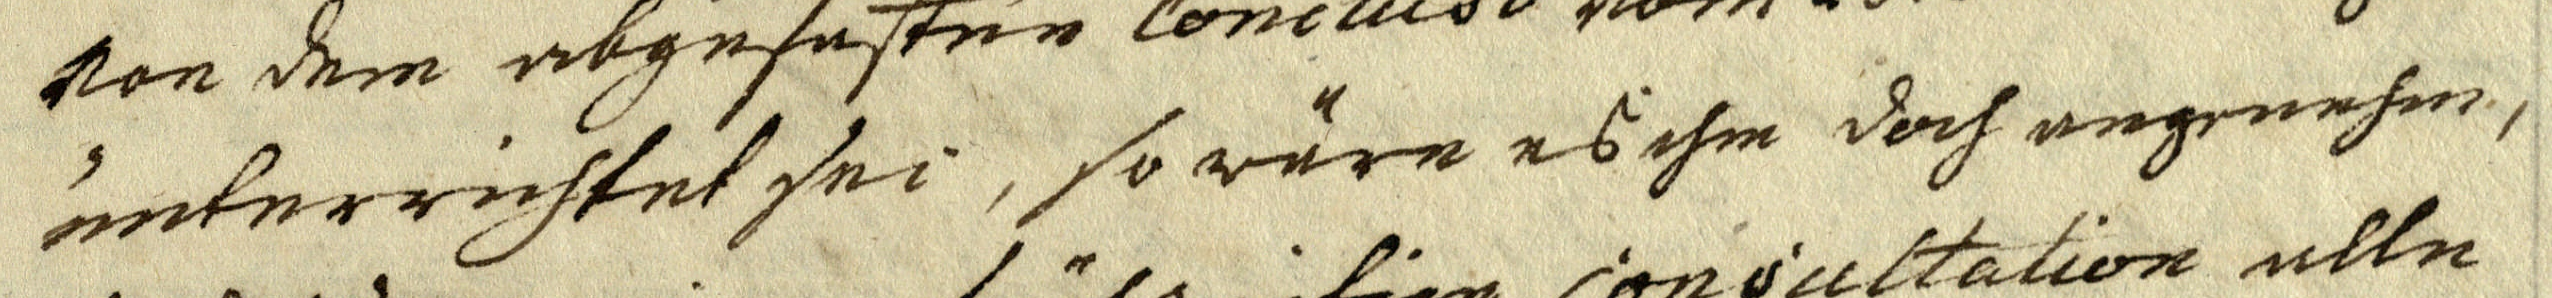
unterrichtet sei, so wäre es ihm doch angenehm,
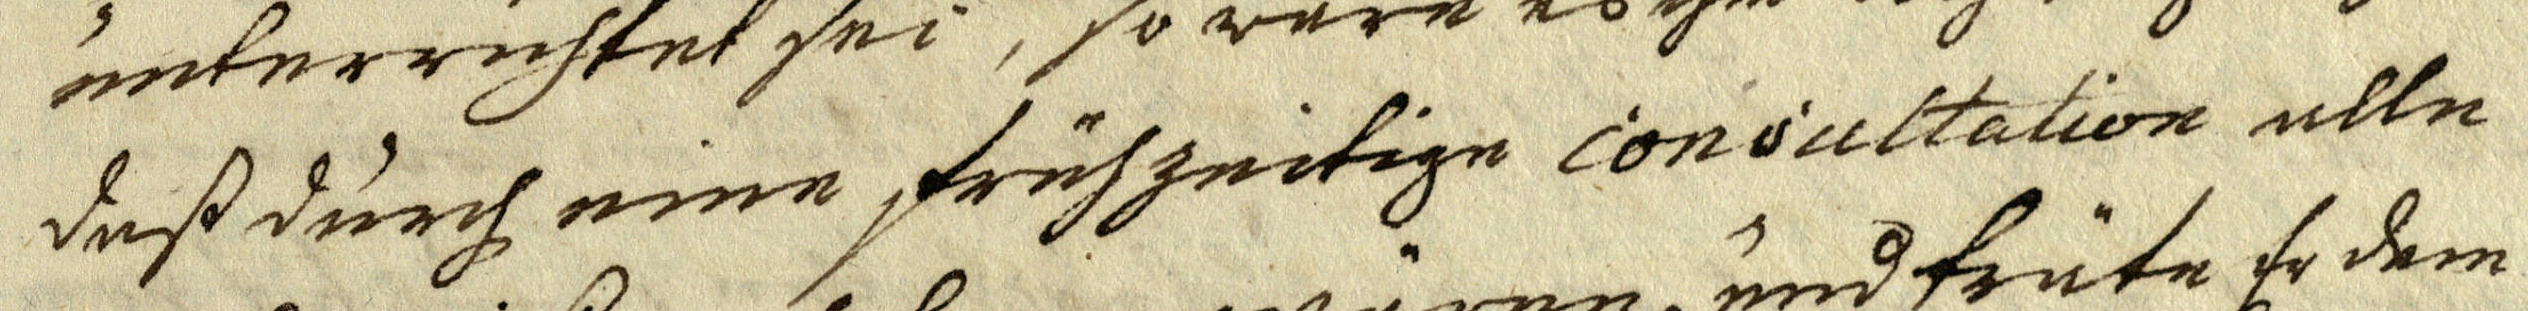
daß durch eine frühzeitige consultation alle
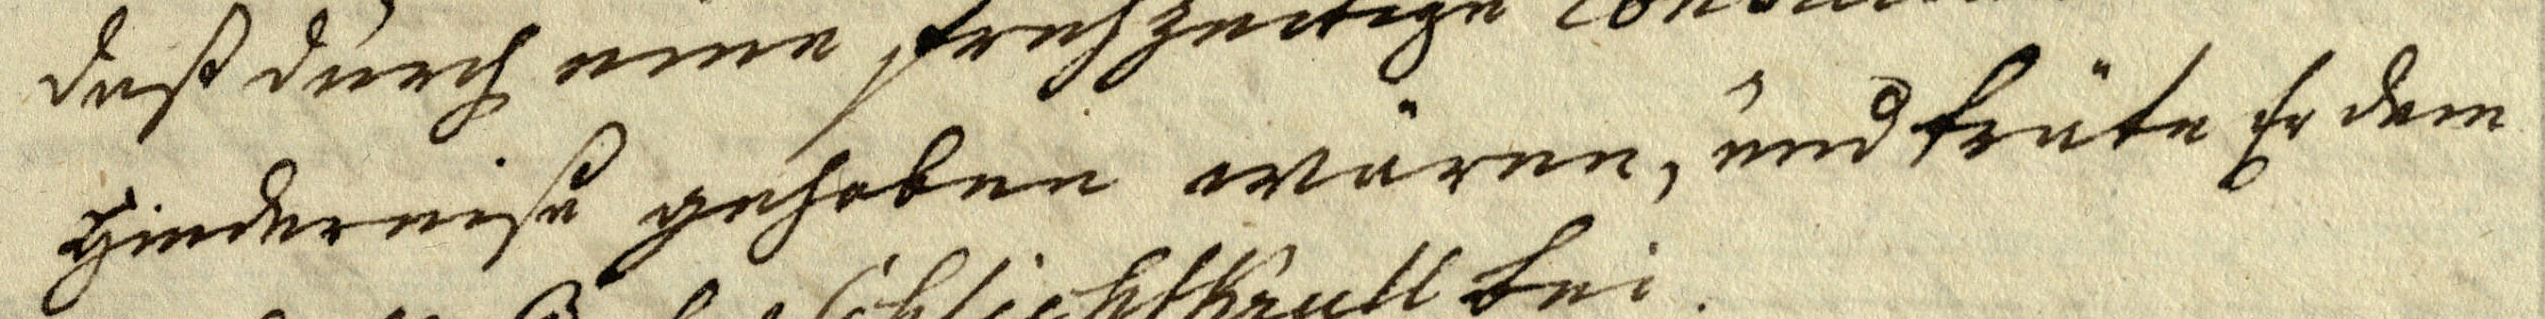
Hinderniße gehoben wären, und träte Er dem
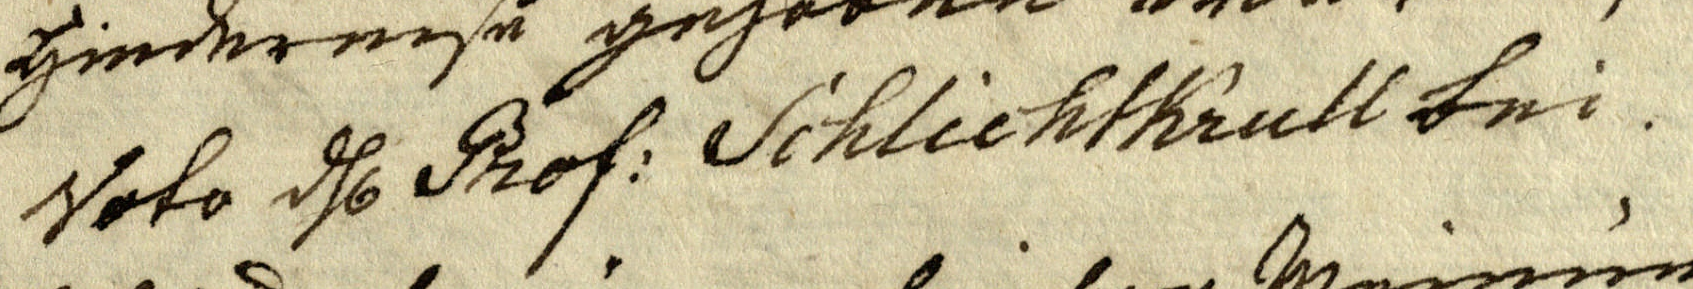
Voto dh Prof. Schlichtkrull bei.
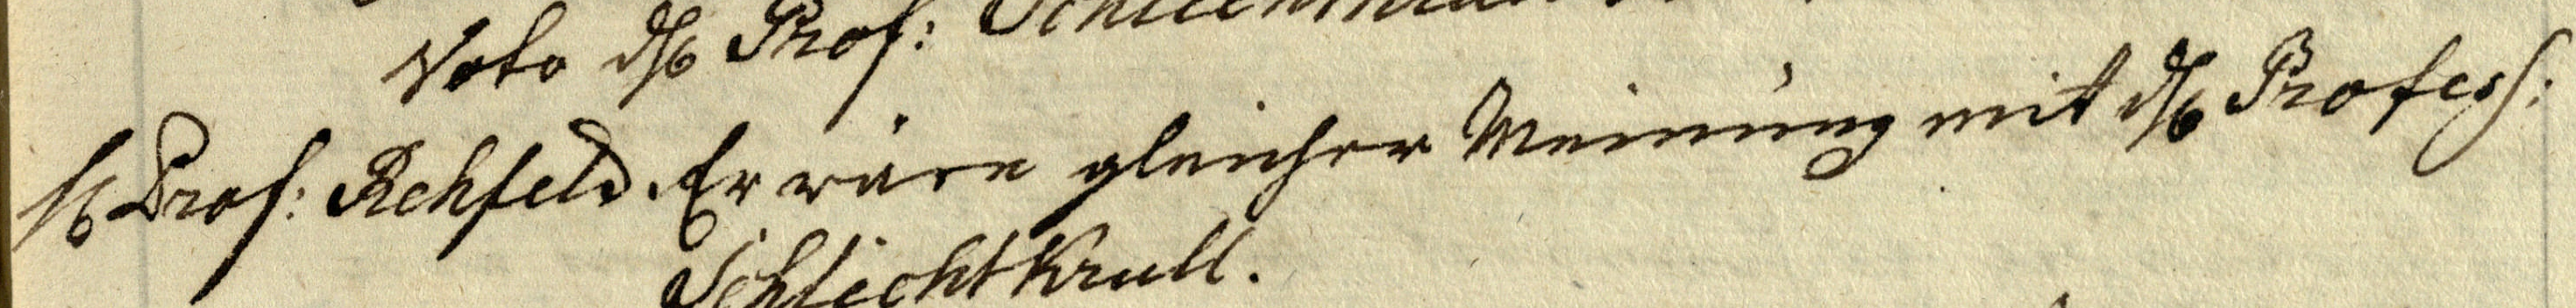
dh Prof. Rehfeld. Er wäre gleicher Meinung mit dh Profess.
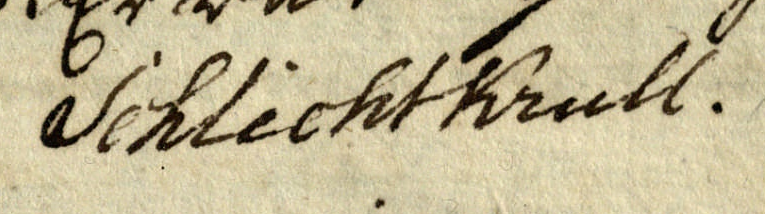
Schlichtkrull.
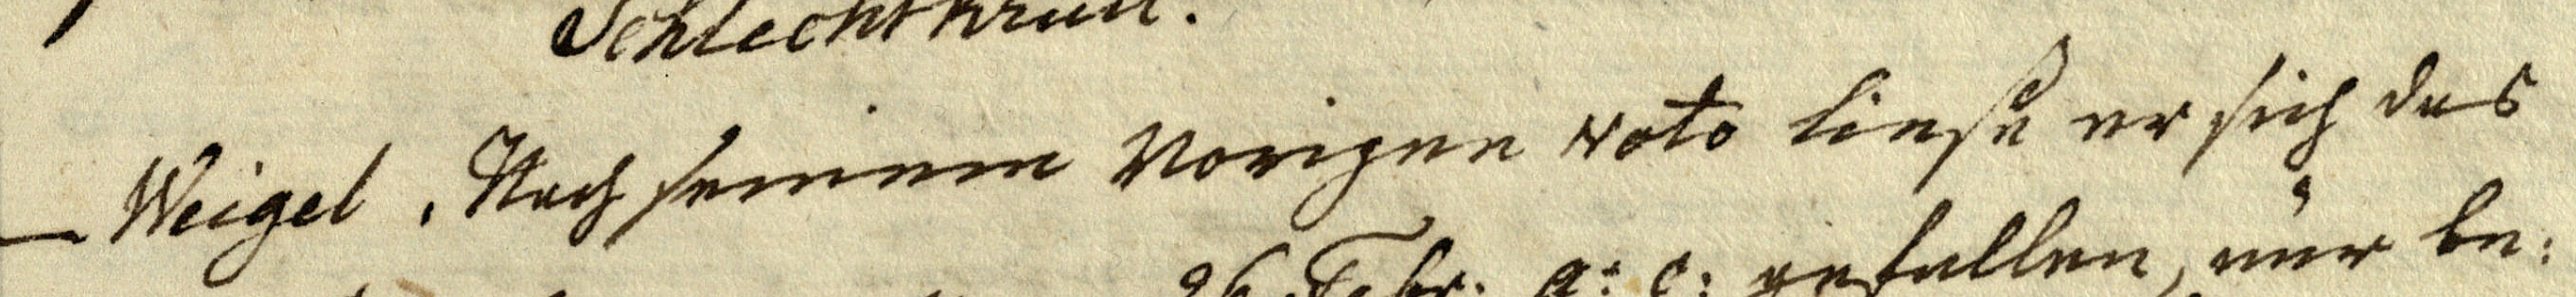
Weigel. Nach seinem vorigen voto ließe er sich das
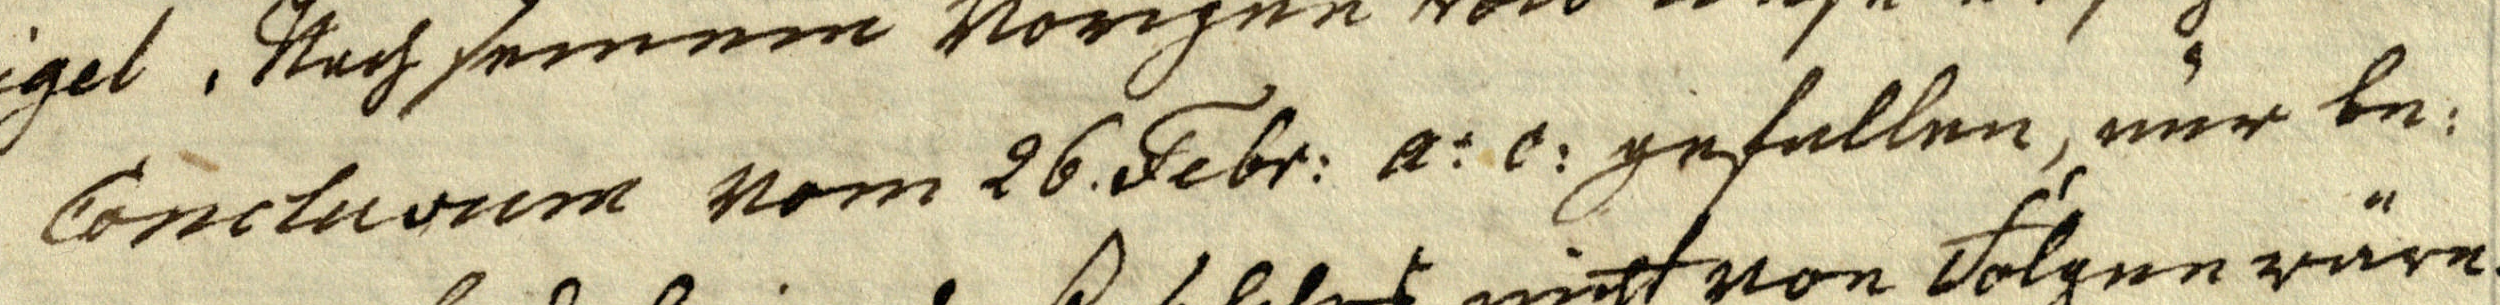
Conclusum vom 26. Febr. a. c. gefallen, nur be¬
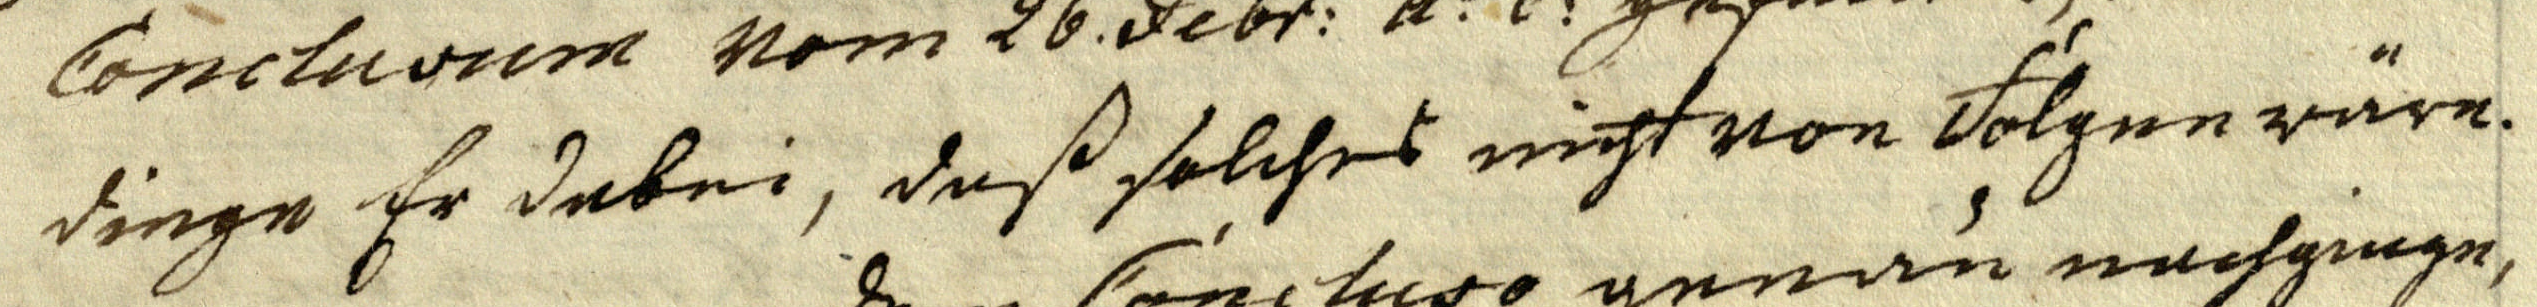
dinge Er dabei, daß solches nicht von Folgen wäre.
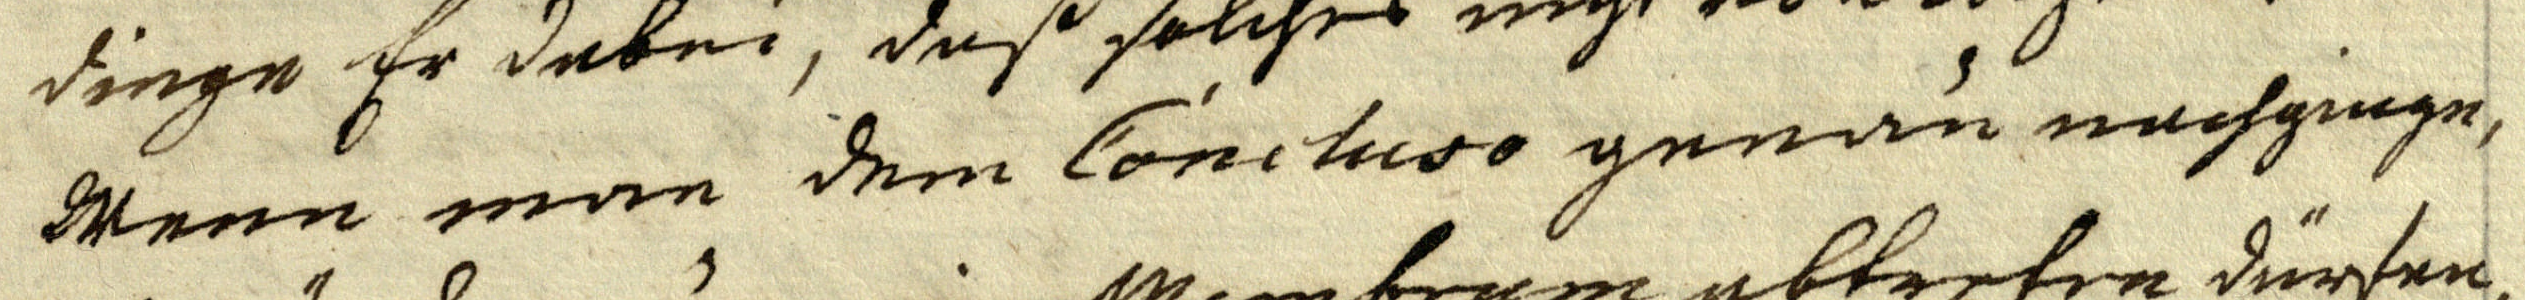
Wenn man dem Concluso genau nachginge,
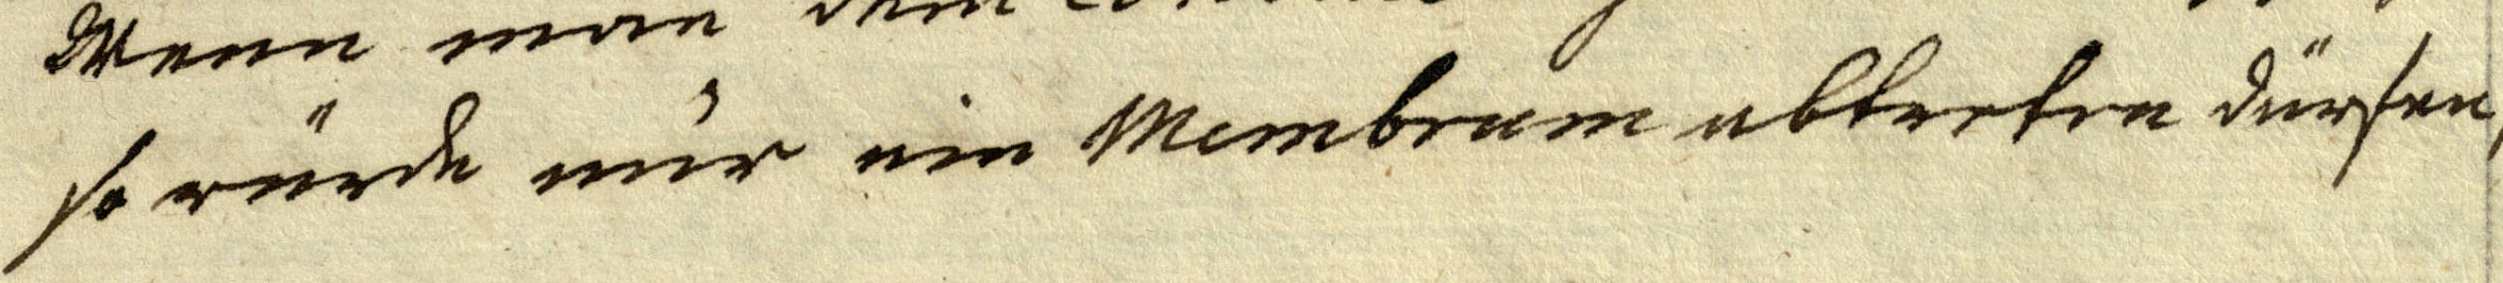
so würde nur ein Membrum abtreten dürfen,
